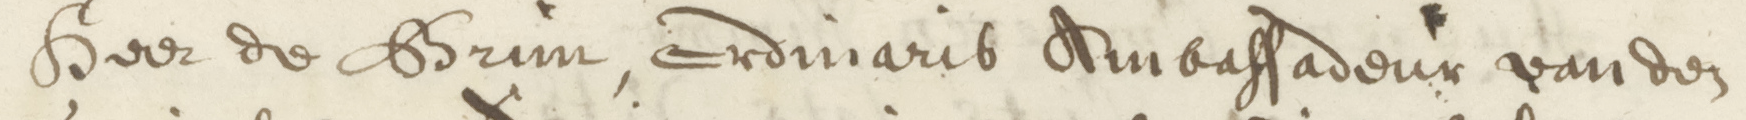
heer de Brun, Ordinaris Ambassadeur van den
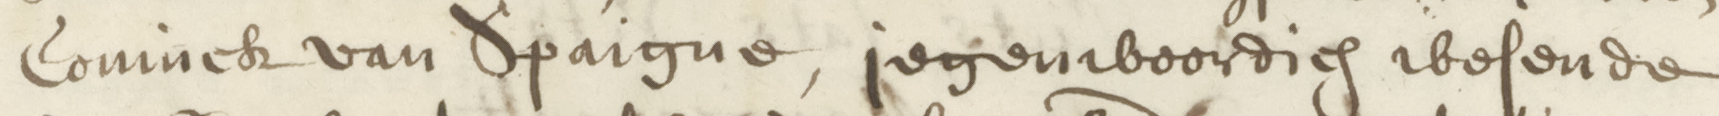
Coninck van Spaigne, jegenwoordich wesende
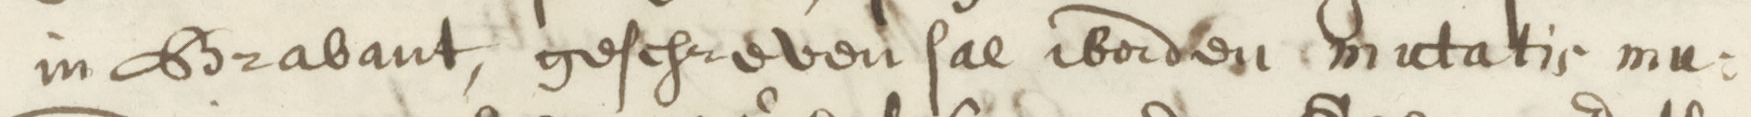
in Brabant, geschreven sal worden, mutatis mu„
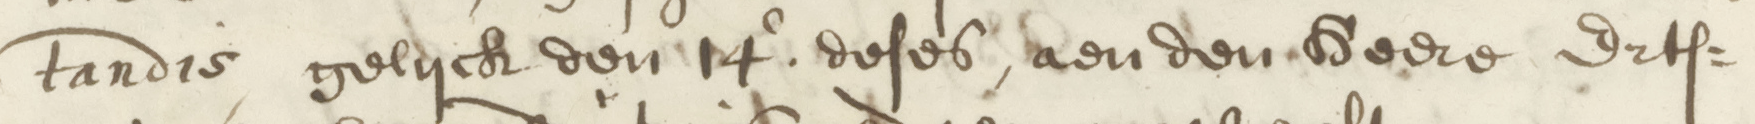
tandis gelyck den 14e. deses, aen den heere Erts=
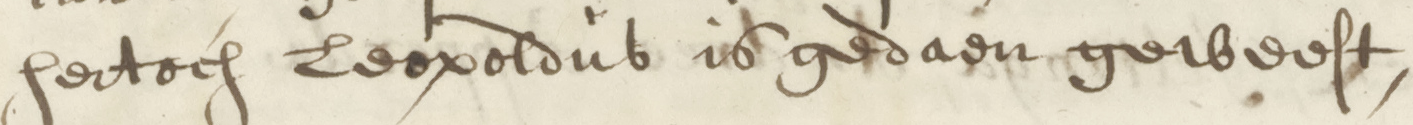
hertoch Leopoldus is gedaen geweest,
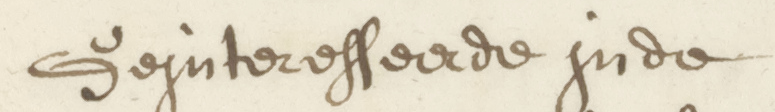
Geinteresseerde inde
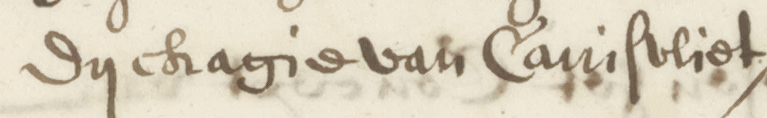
Dyckagie van Canisvliet
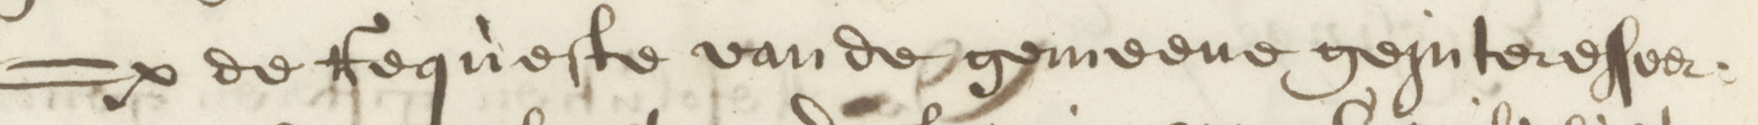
Op de Requeste van de gemeene geinteresseer=
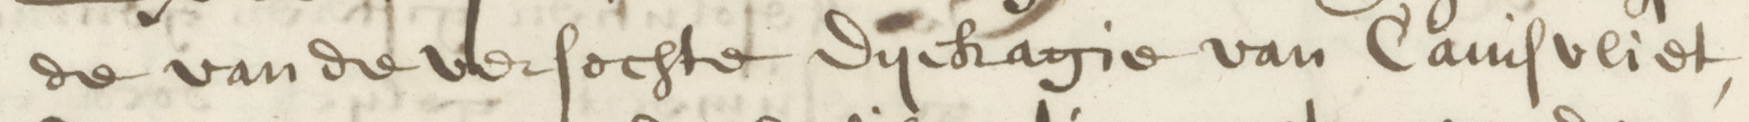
de van de versochte Dyckagie van Canisvliet,
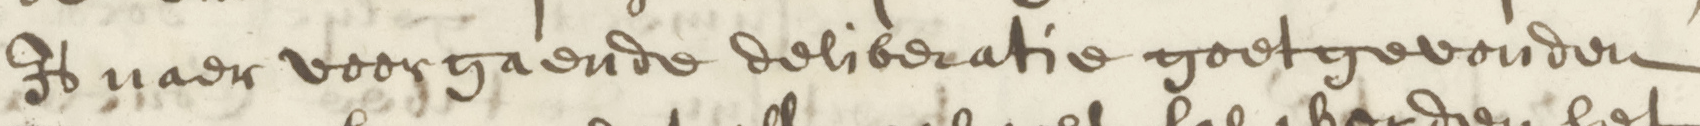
Is naer voorgaende deliberatie goetgevonden
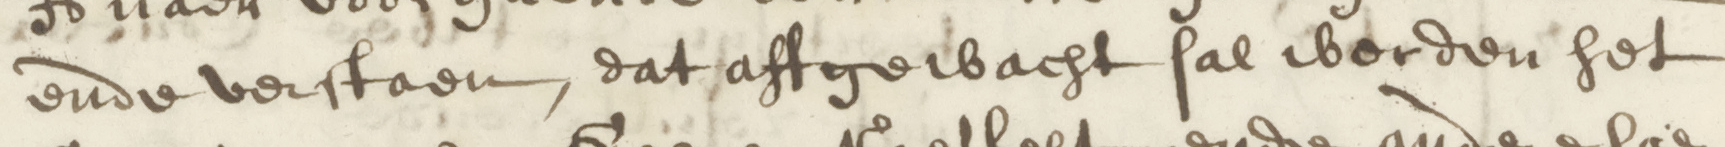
ende verstaen, dat affgewacht sal worden het
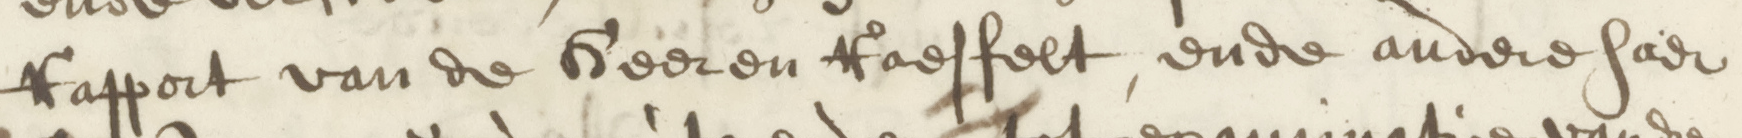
Rapport van de Heeren Raesfelt, ende andere haer
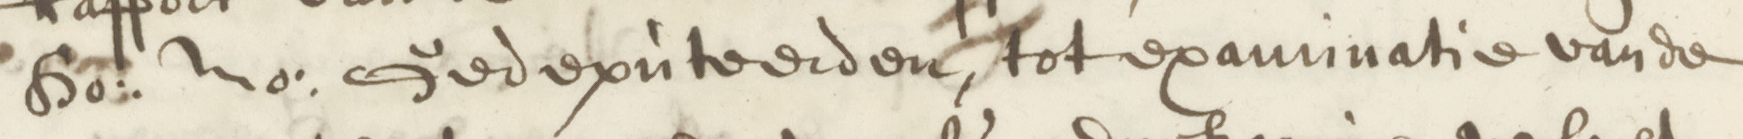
Ho:Mo: Gedeputeerden, tot examinatie van de
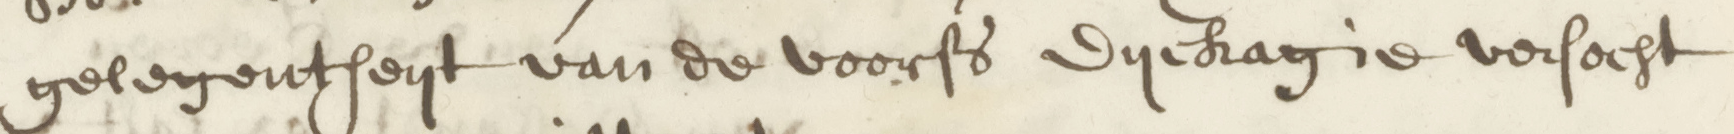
gelegentheyt van de voors Dyckagie versocht
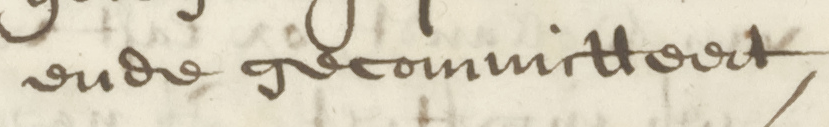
ende gecommitteert
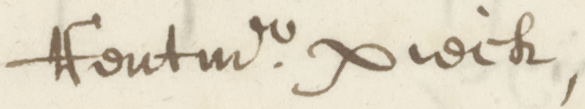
Rentmr. Pieck,
